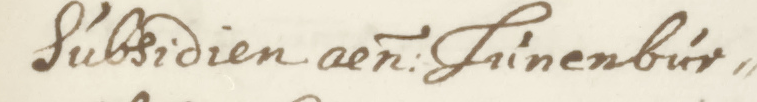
Subsidien aen: Lunenbur,,
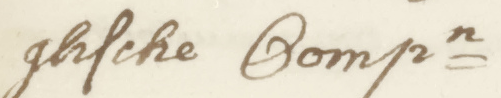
ghsche Compn.
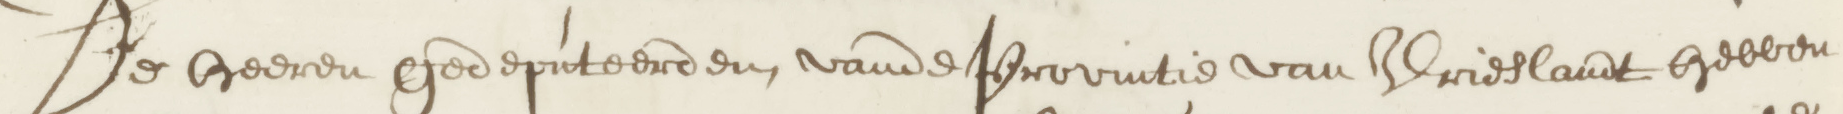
De heeren gedeputeerden, vande Provintie van Vrieslandt hebben
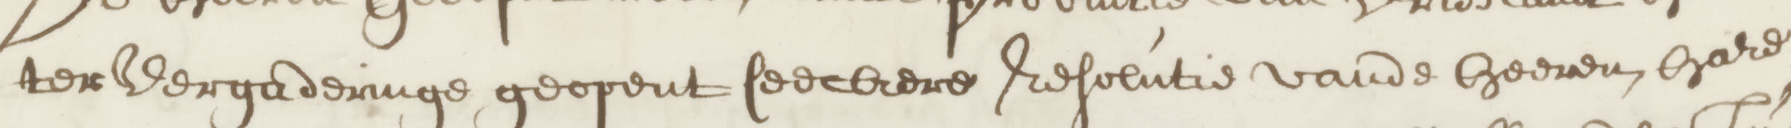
ter Vergaderinge geopent seeckere Resolutie vande heeren hare
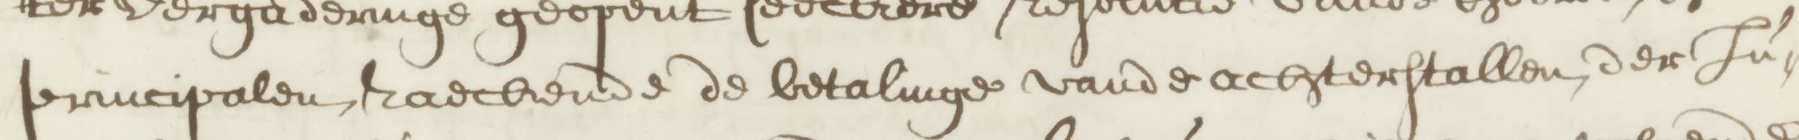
principalen, raeckende de betalinge vande achterstallen der Lu,,
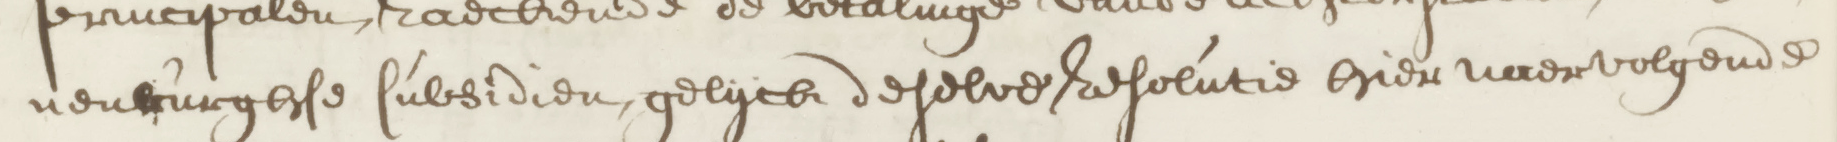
neuburghse subsidien, gelijck deselve Resolutie hier naervolgende
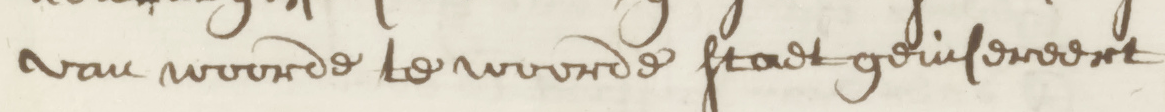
van woorde te woorde staet geinsereert.
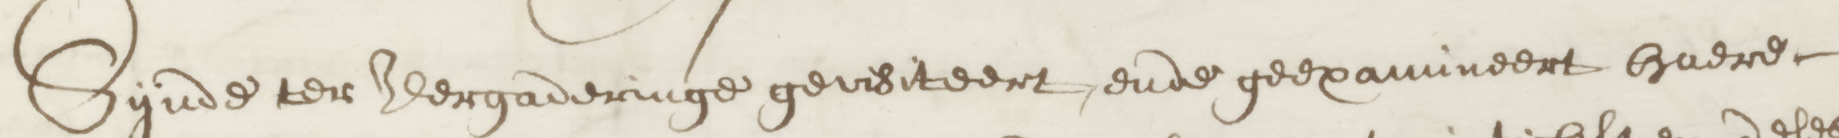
Sijnde ter Vergaderinge gevisiteert, ende geexamineert haere —
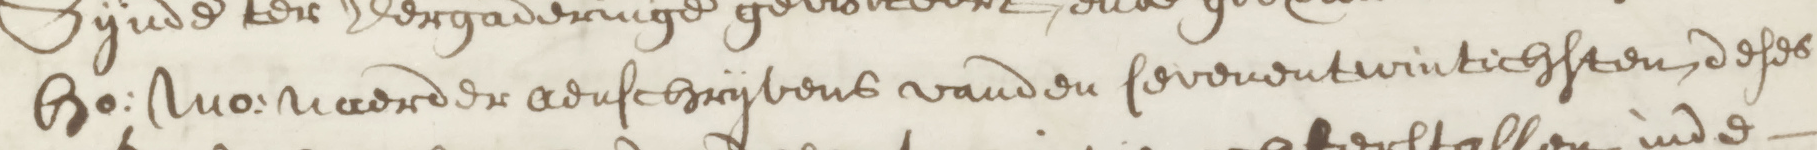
Ho:Mo: naerder aenschrijvens vanden sevenentwintichsten deses
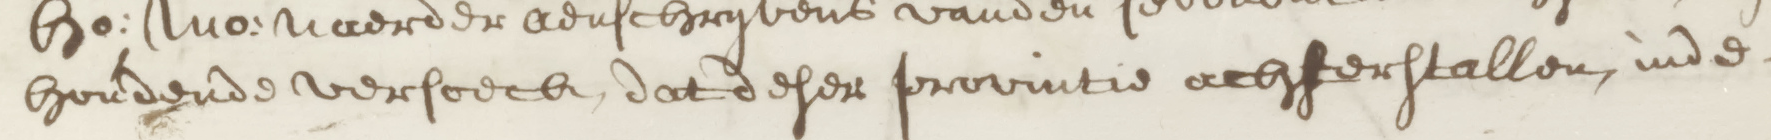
houdende versoeck, dat deser provintie achterstallen, inde —
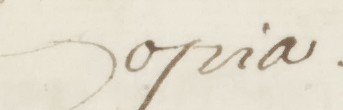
Copia.
